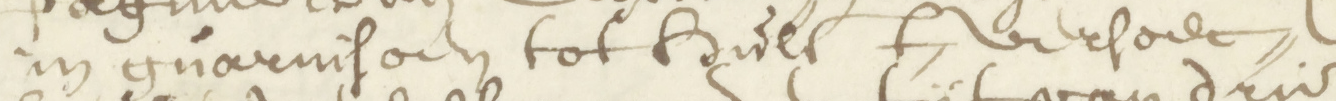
in guarnisoen tot Hulst, versoec„
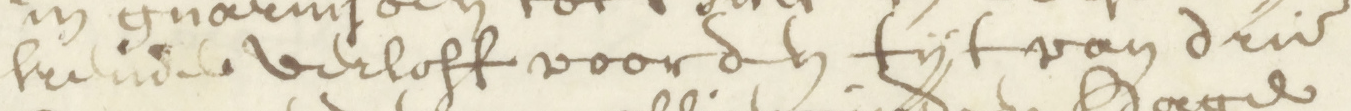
kende verloff voor den tijt van drie
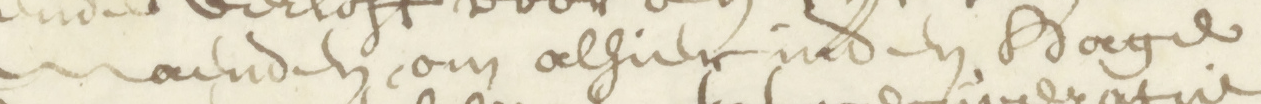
maenden, om alhier inden Hage
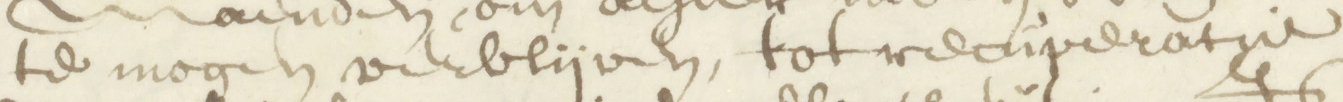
te mogen verblijven, tot recuperatie
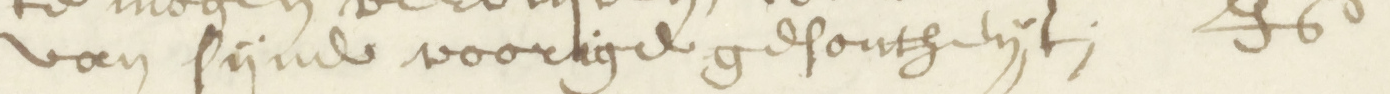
van sijne voorige gesontheijt; is
